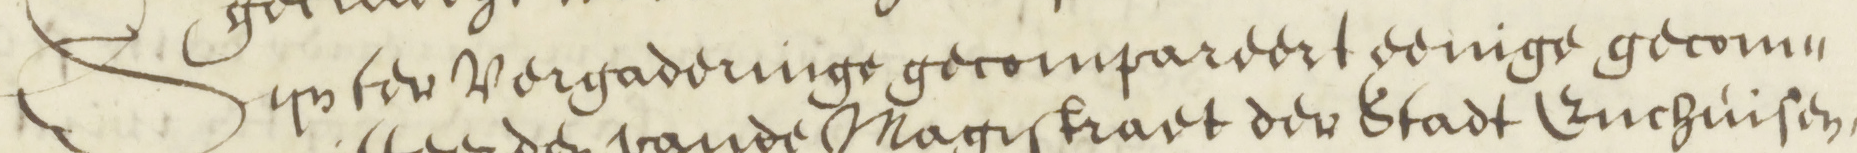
Syn ter vergaderinge gecompareert eenige gecom„
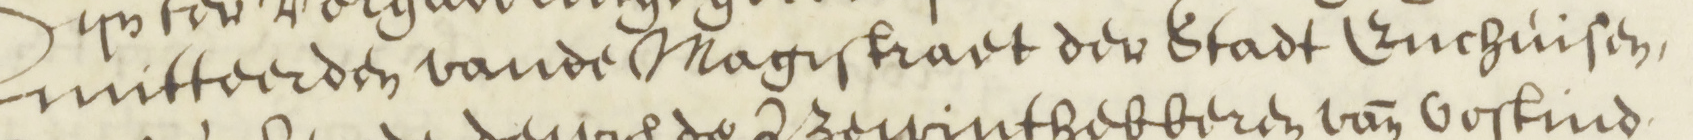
mitteerden vande Magistraet der Stadt Enchuisen,
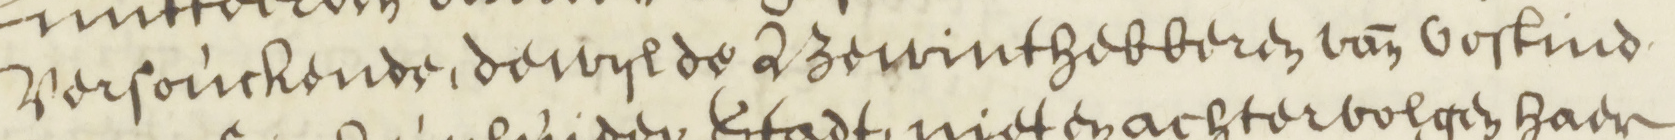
versouckende dewyl de Bewinthebberen van Oostind
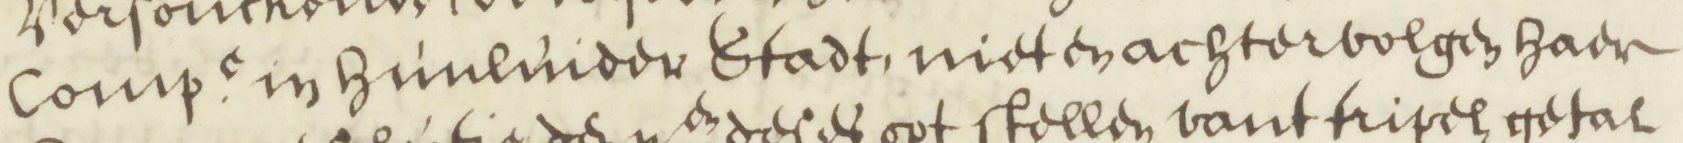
Compe. in hunluider Stadt, niet en achtervolgen haer
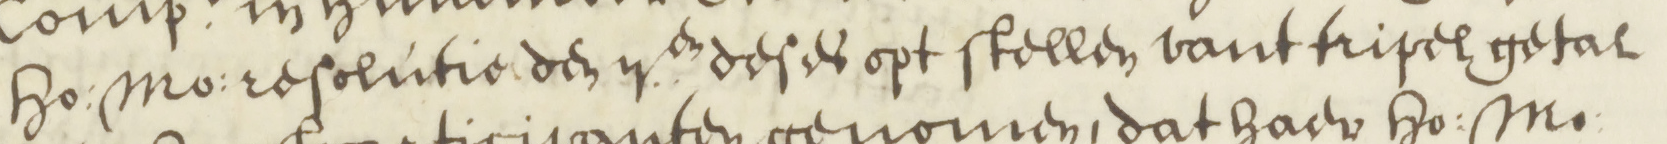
Ho:Mo: resolutie den ijen deses opt stellen vant tripel getal
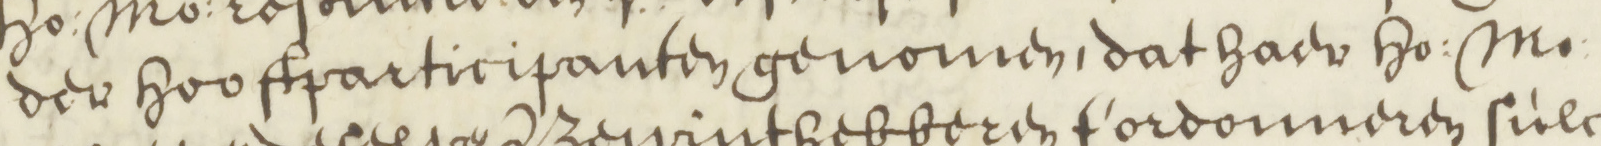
der hooftparticipanten genomen, dat haer Ho:Mo:
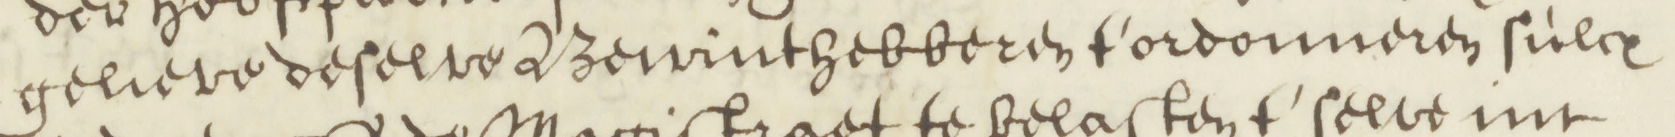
gelieve deselve Bewinthebberen t'ordonneren sulcx
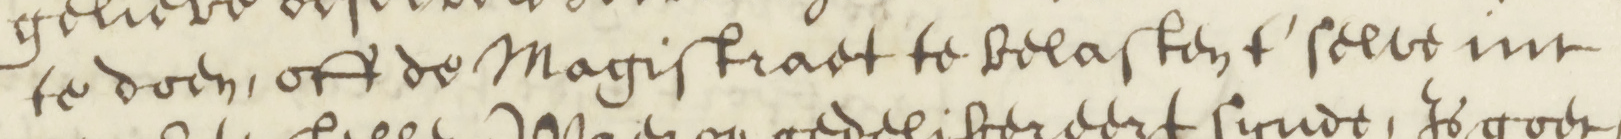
te doen, off de magistraet te belasten 't selve int
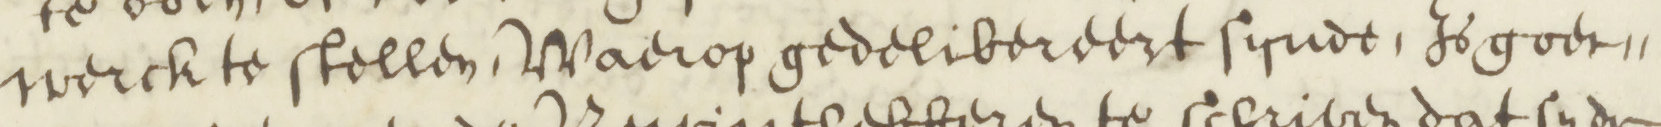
werck te stellen. Waerop gedelibereert sijnde, Is goet„
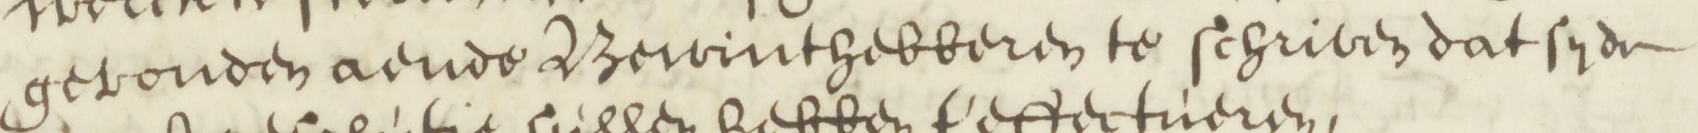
gevonden aende Bewinthebberen te schriven dat sy de
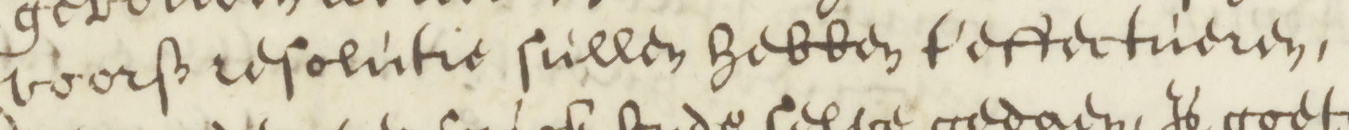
voors resolutie sullen hebben t'effectueren.
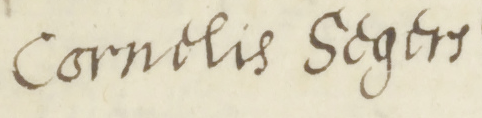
Cornelis Segers
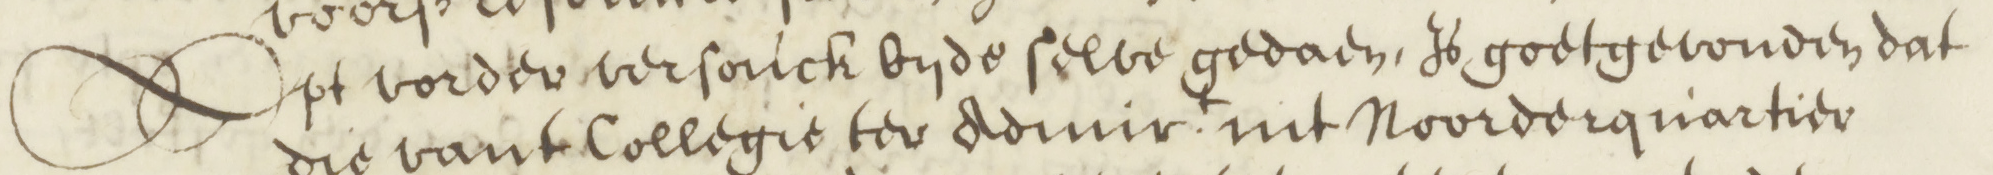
Opt vorder versouck byde selve gedaen, Is goetgevonden dat
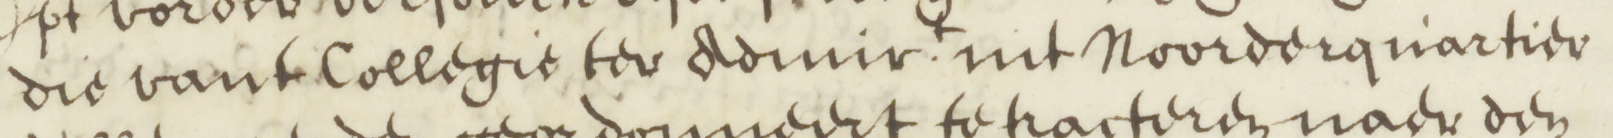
die vant Collegie ter Admirt int Noorderquartier
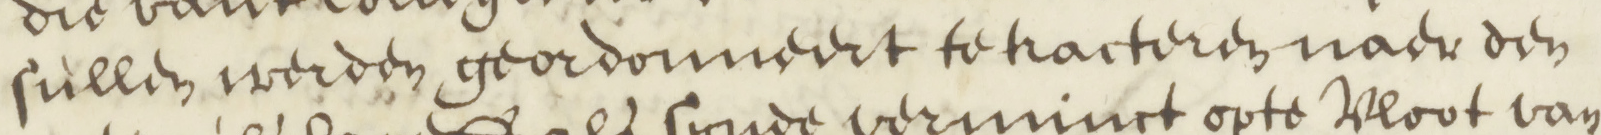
sullen werden geordonneert te tracteren naer den
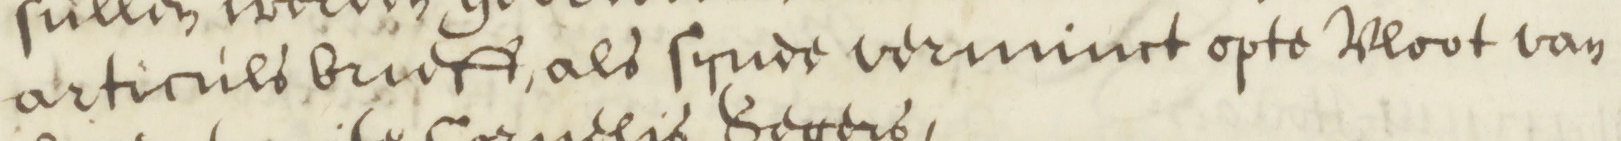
articuls brieff, als synde verminct opte Vloot van
